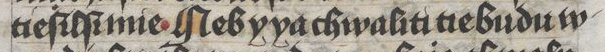tieẛilſi mie.Neb y ya chwaliti tiebudu w¬
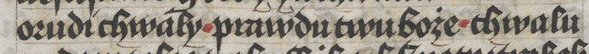orudi chwály.prawdu twu boże.chwalu
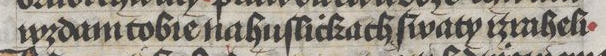wrdam tobie nahuſliċkach ſwaty izraheli.
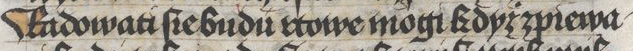Radowati ſie budu rtowe mogi kdyż zpiewa¬
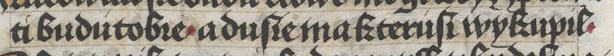ti budu tobie.a duẛie ma kterú ſi wykupil.
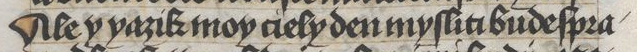Ale y yazik moy ciely den myſliti budeſpra¬
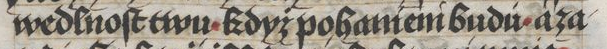wedlnoſt twu.kdyż pohanieni budú.a za¬
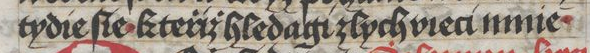tydie ſie.kteṙíż hledagí zlych vieci mnie.
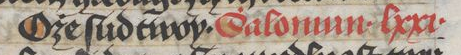Ože ſúd twoy.Ṡalomun.lxxi.
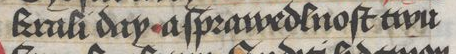krali day.a ſprawedlnoſt twú
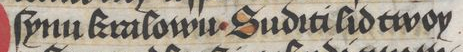ſynu kralowu.Suditi lid twoy
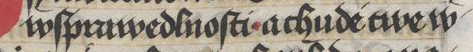wſprawedlnoſti.a chude twe w¬
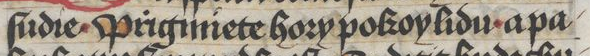ſudie.Pṙigmiete hory pokoy lidu.a pa¬
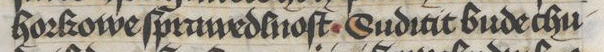horkowe ſprawedlnoſt.Suditit bude chu¬
